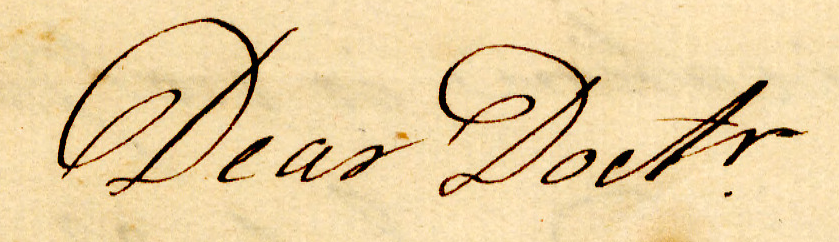Dear Doct^r.
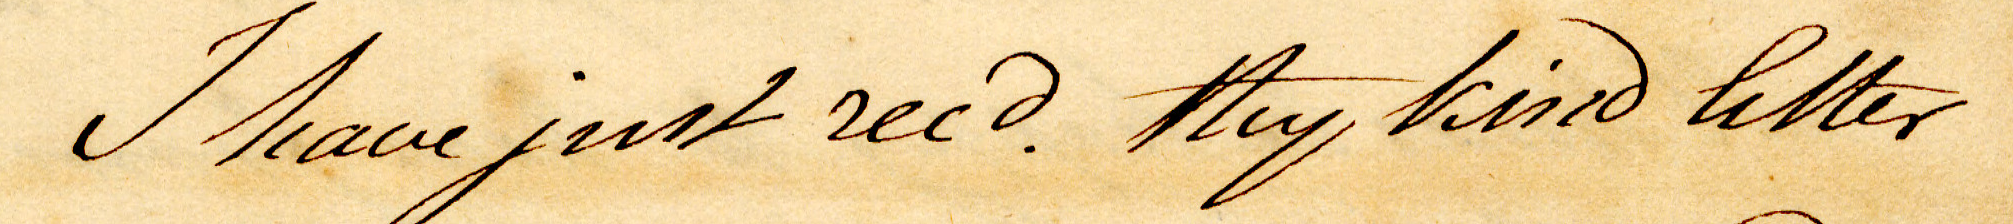I have just recd. thy kind letter
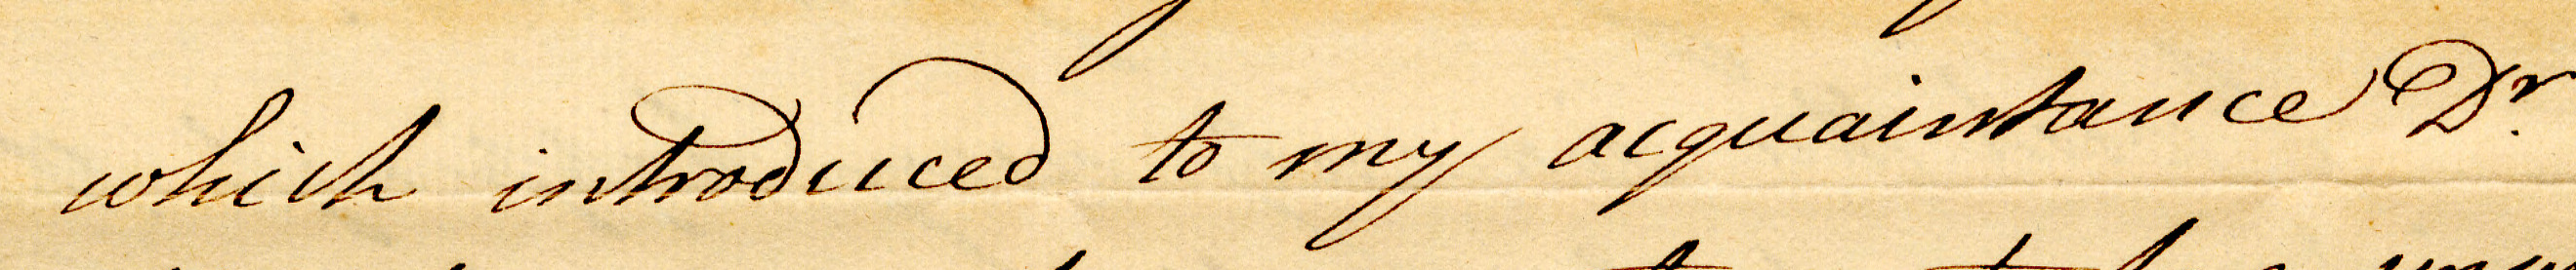which introduced to my acquaintance D^r.
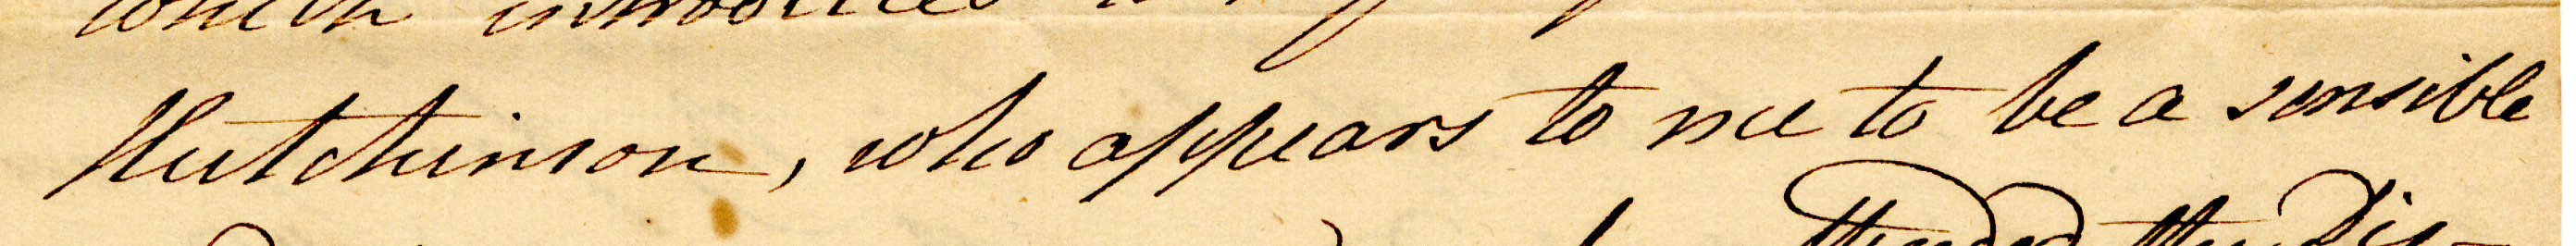Hutchinson, who appears to me to be a sensible
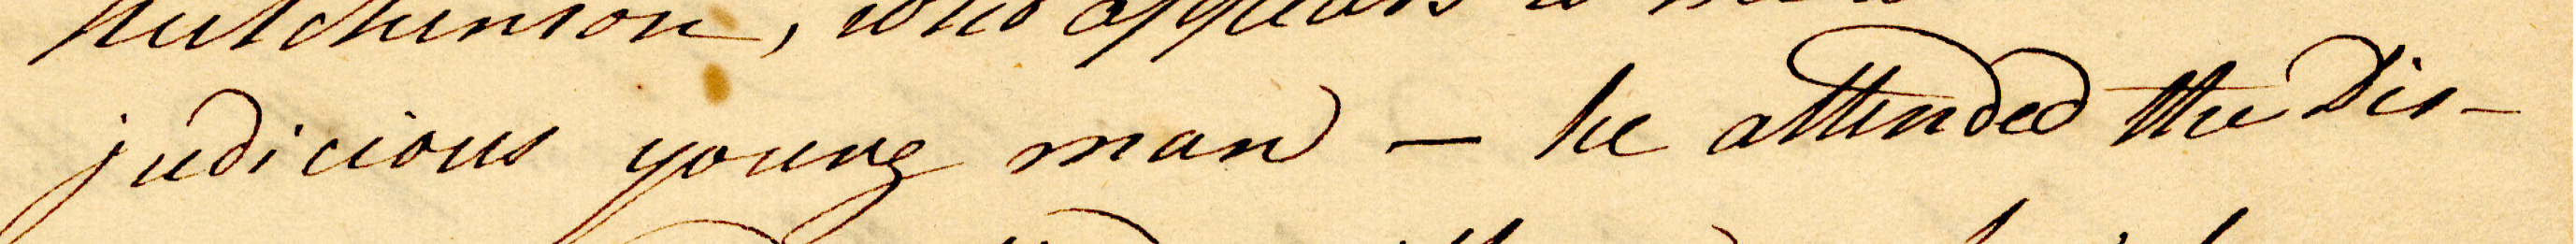judicious young man- he attended the Dis-
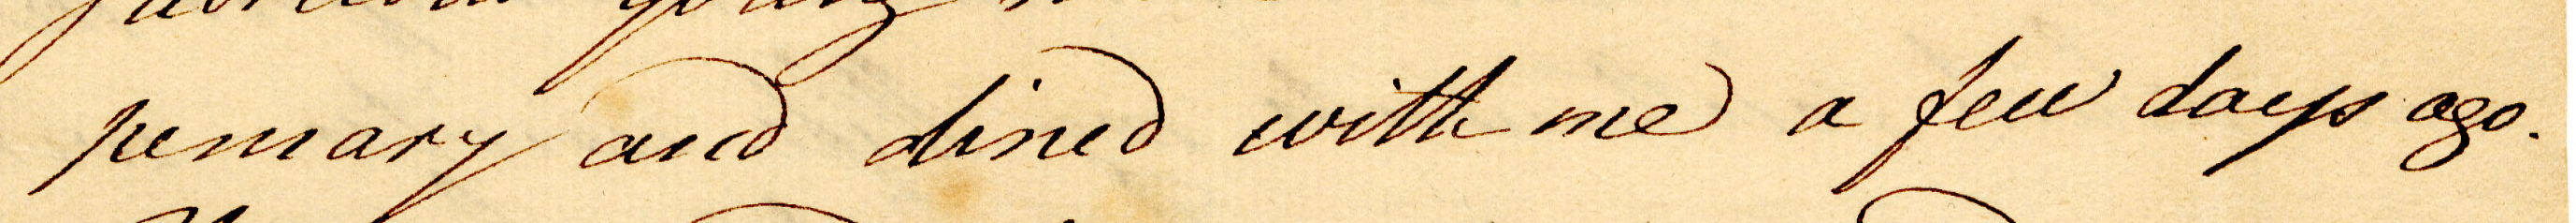pensary and dined with me a few days ago.
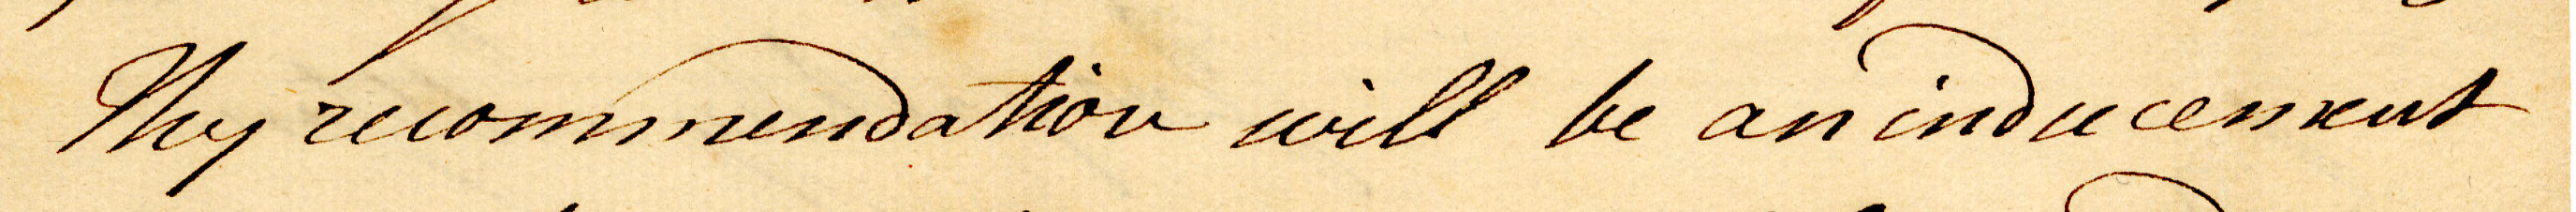My recommendation will be an inducement
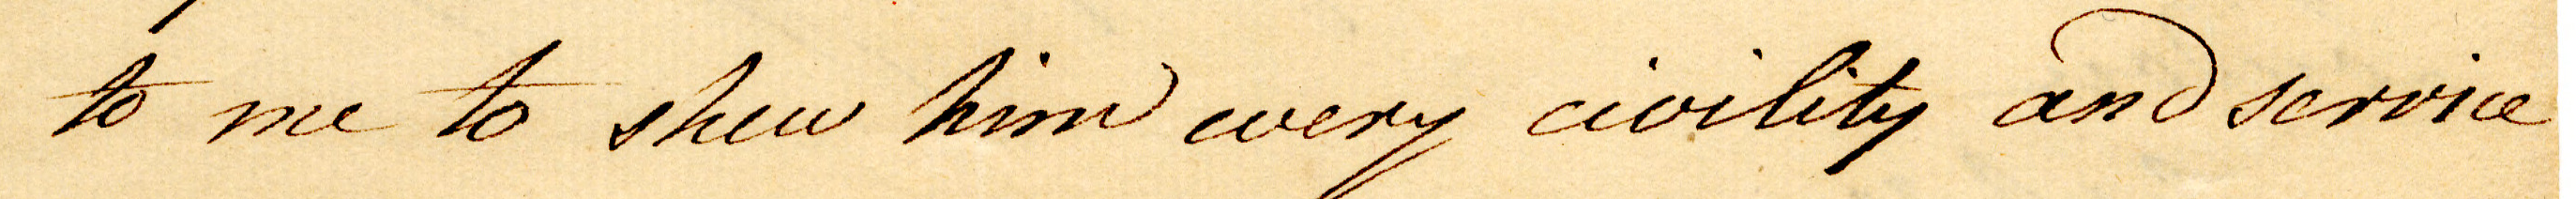to me to shew him every civility and service
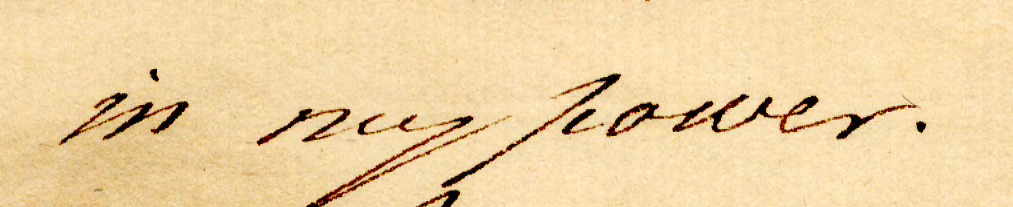in my power.
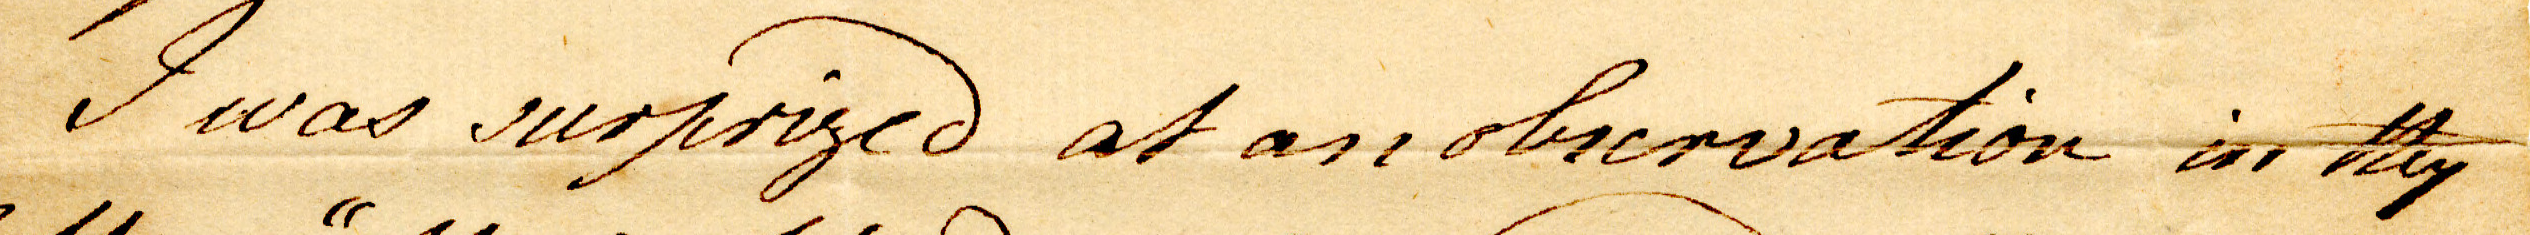I was surprized at an observation in thy
